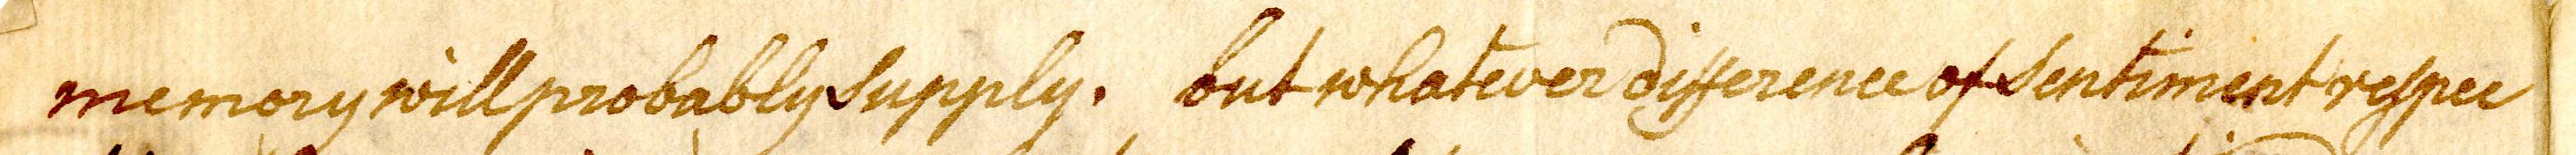memory will probably Supply. but whatever difference of Sentiment respec
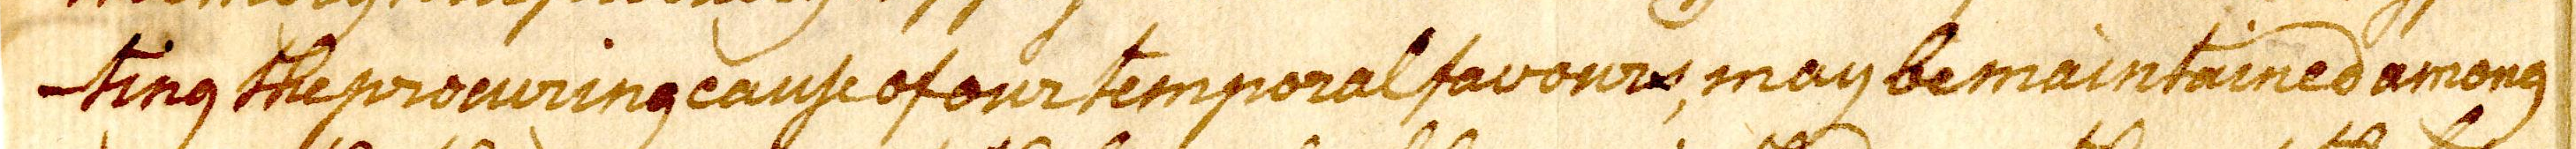-ting the procuring cause of our temporal favours, may be maintained among
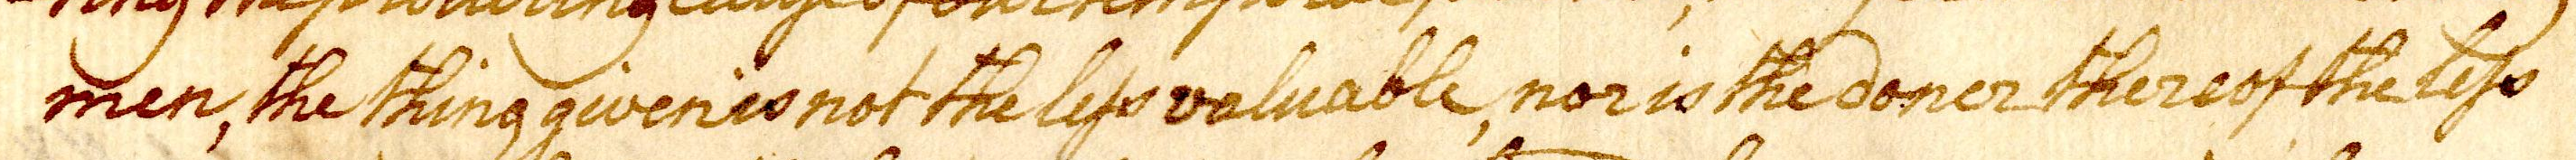men, the thing given is not the less valuable, nor is the donor thereof the less
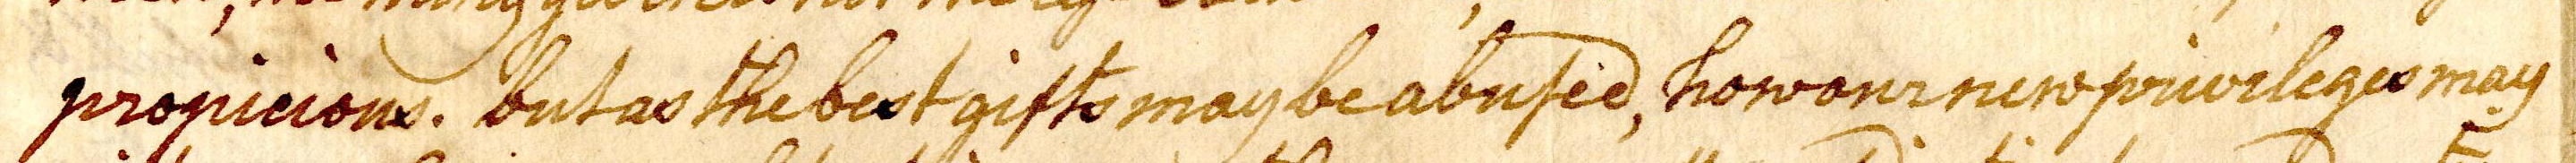propicious. but as the best gifts may be abused, how our new privileges may
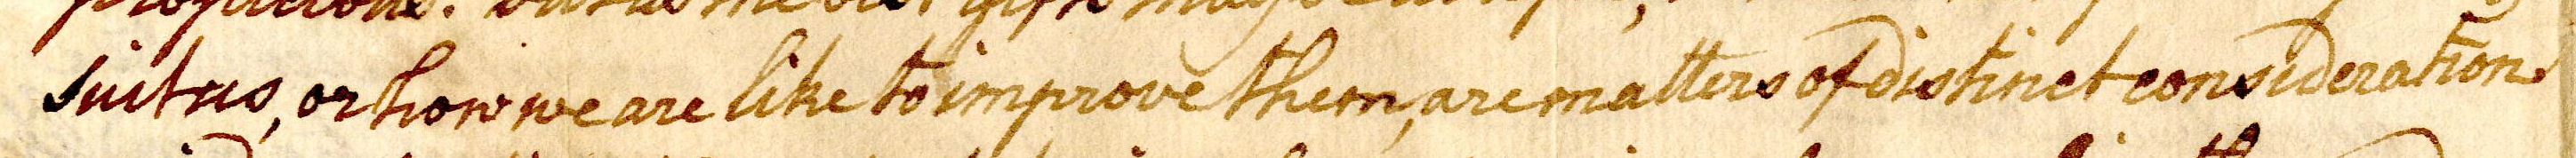suit us, or how we are like to improve them are matters of distinct consideration
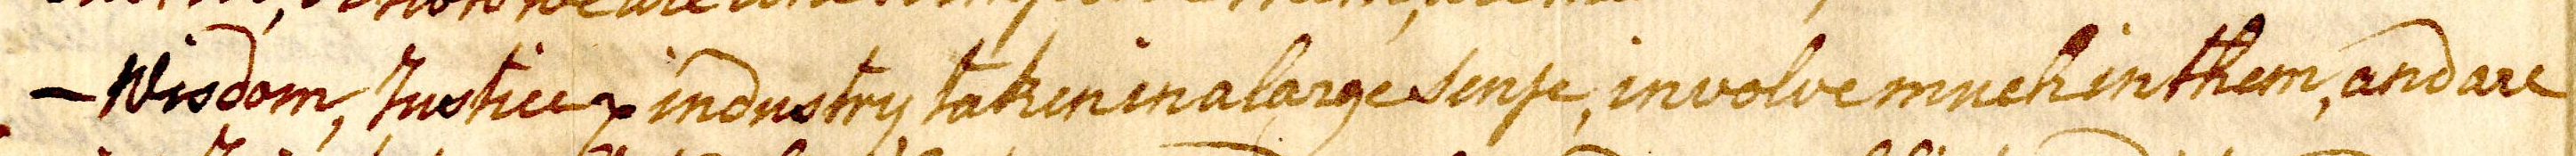-Wisdom, Justice & industry taken in a large sense, involve much in them, and are
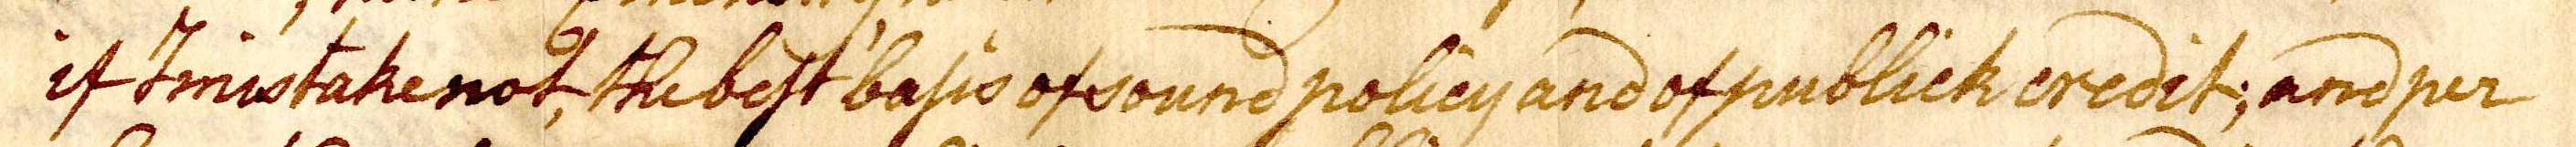if I mistake not, the best basis of sound policy and of publick credit; and per
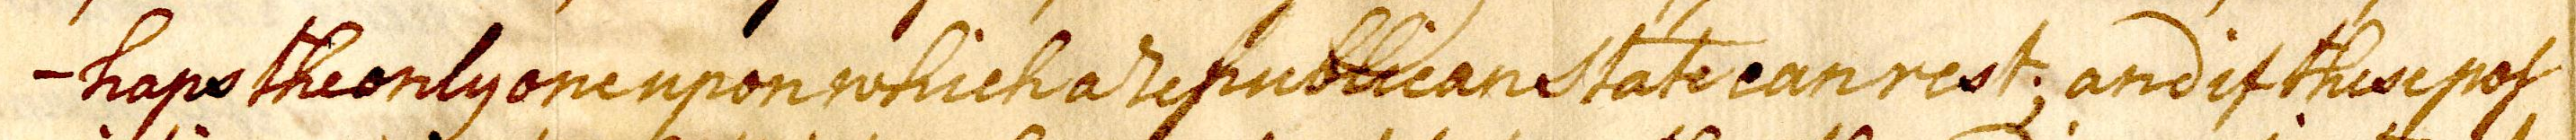-haps the only one upon which a republican State can rest; and if these pos
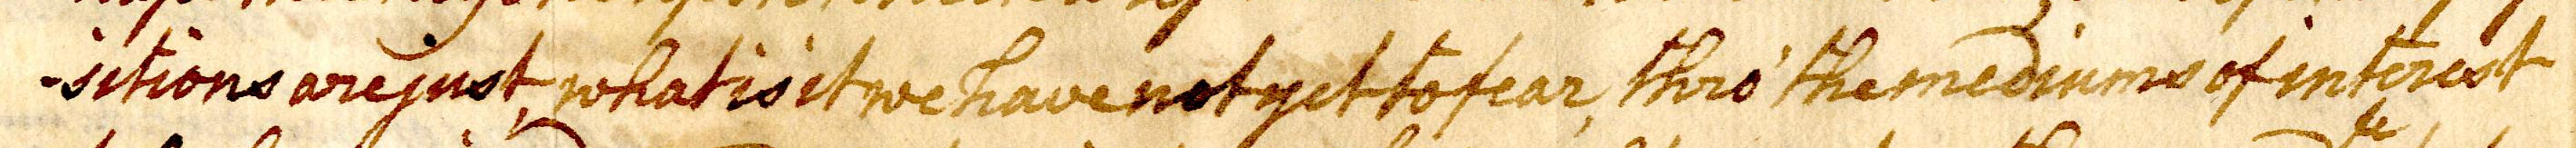-sitions are just, what is it we have not yet to fear, thro' the mediums of interest
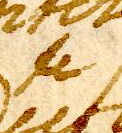fe
